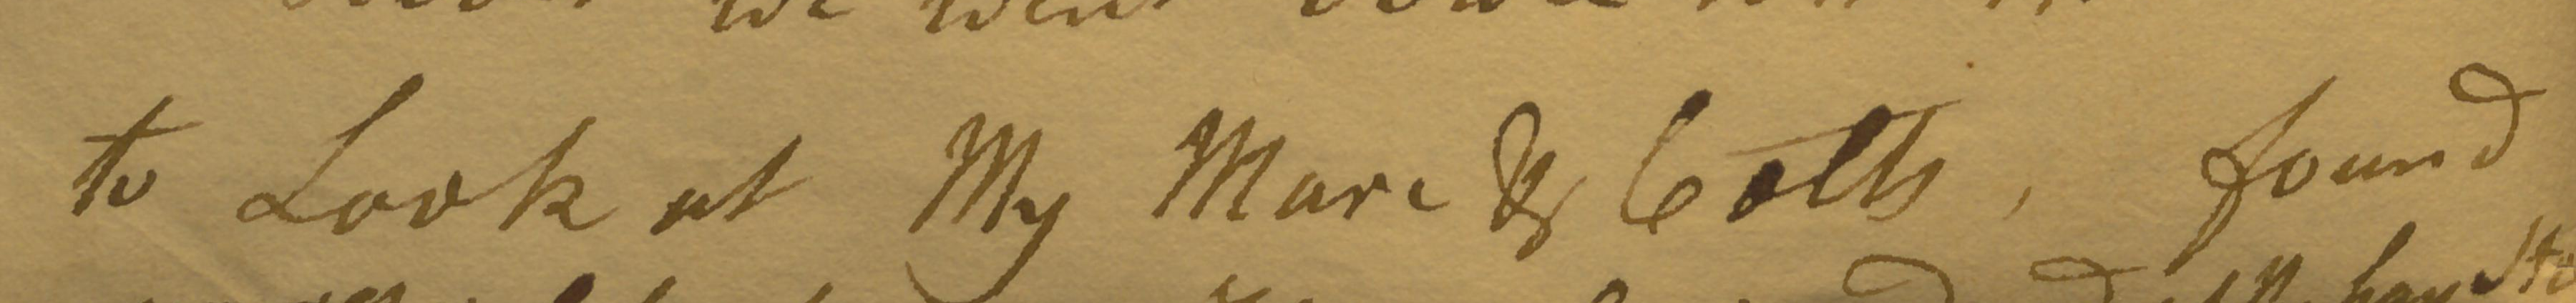to Look at My Mare & Colts, found
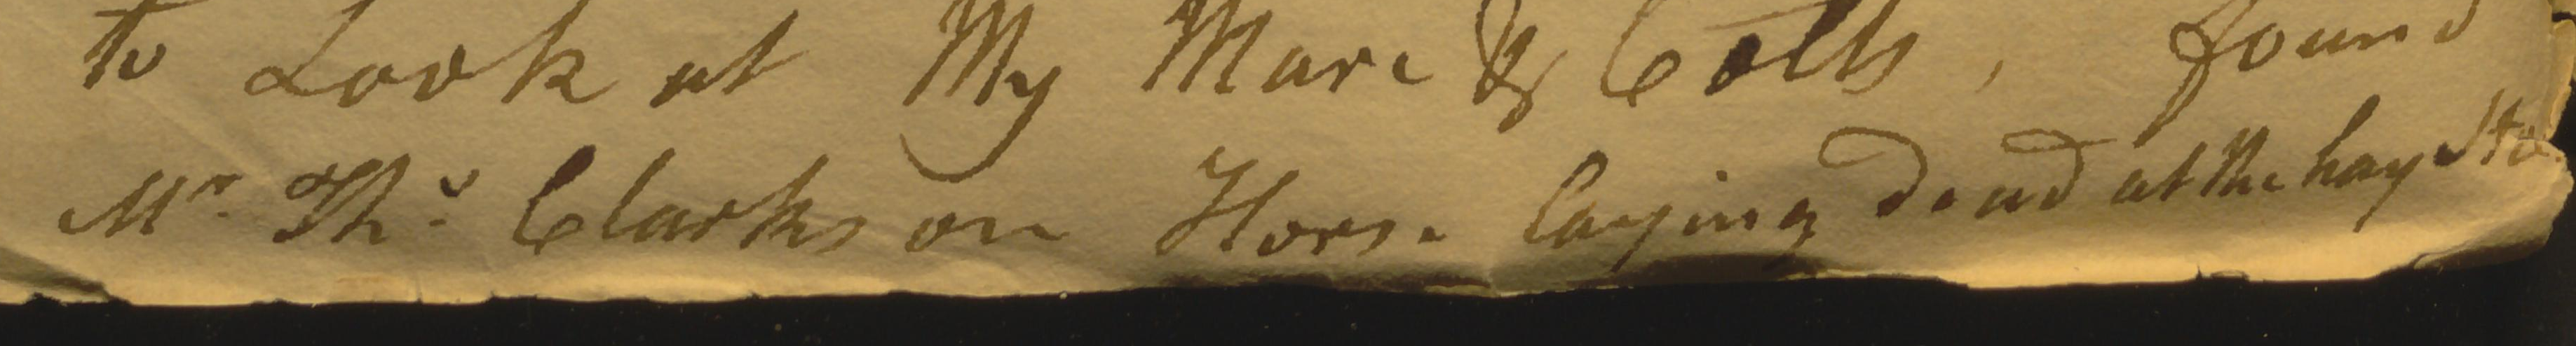M^r. Th^s. Clarks on Horse. laying dead at the St
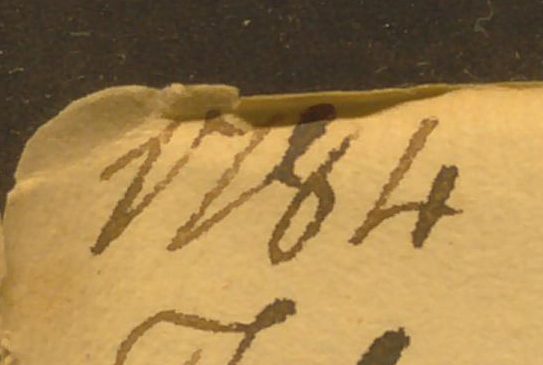1784
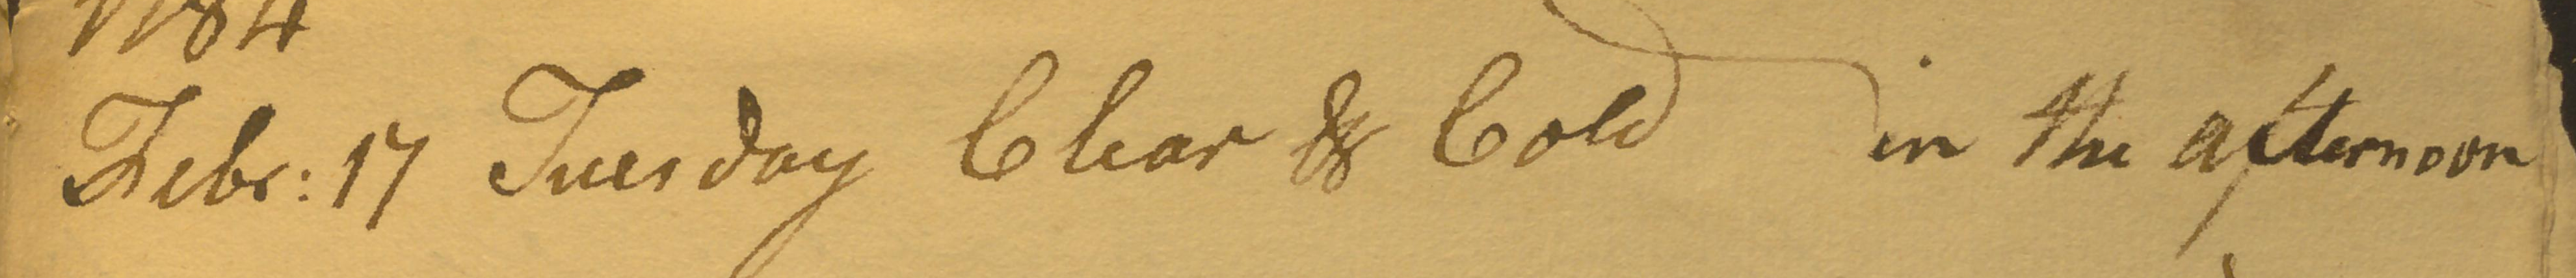Febr: 17 Tuesday Clear & Cold in the afternoon
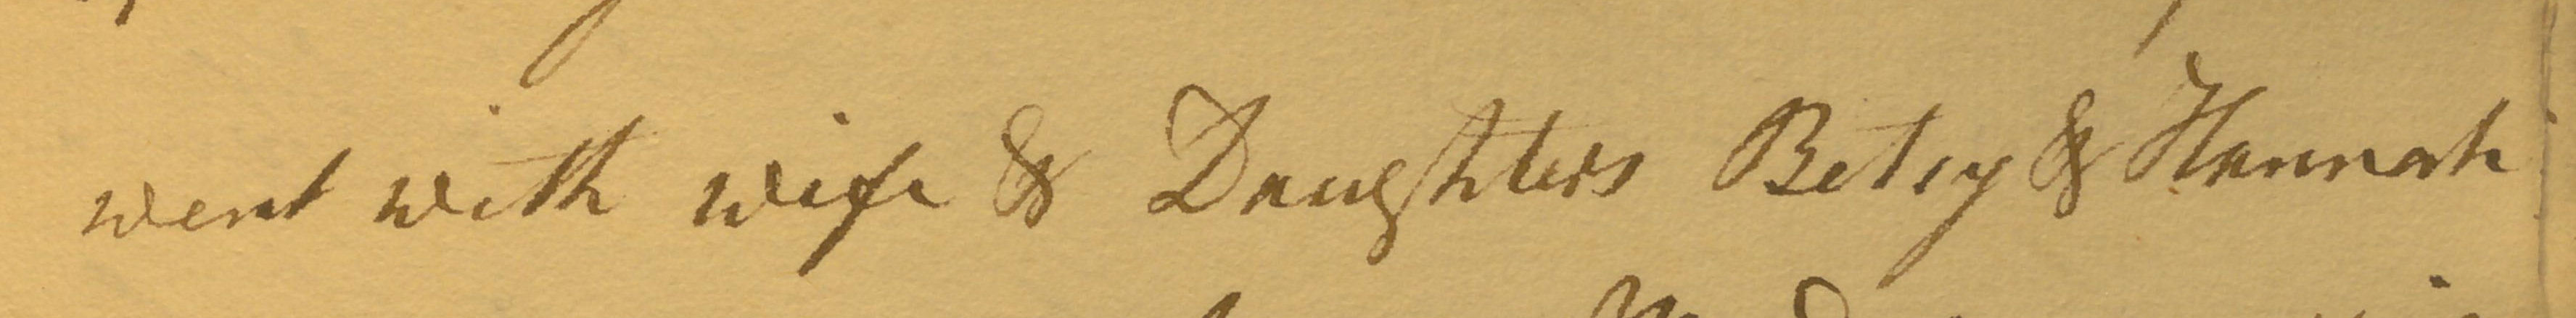went with wife & Daughters Betsy & Hannah
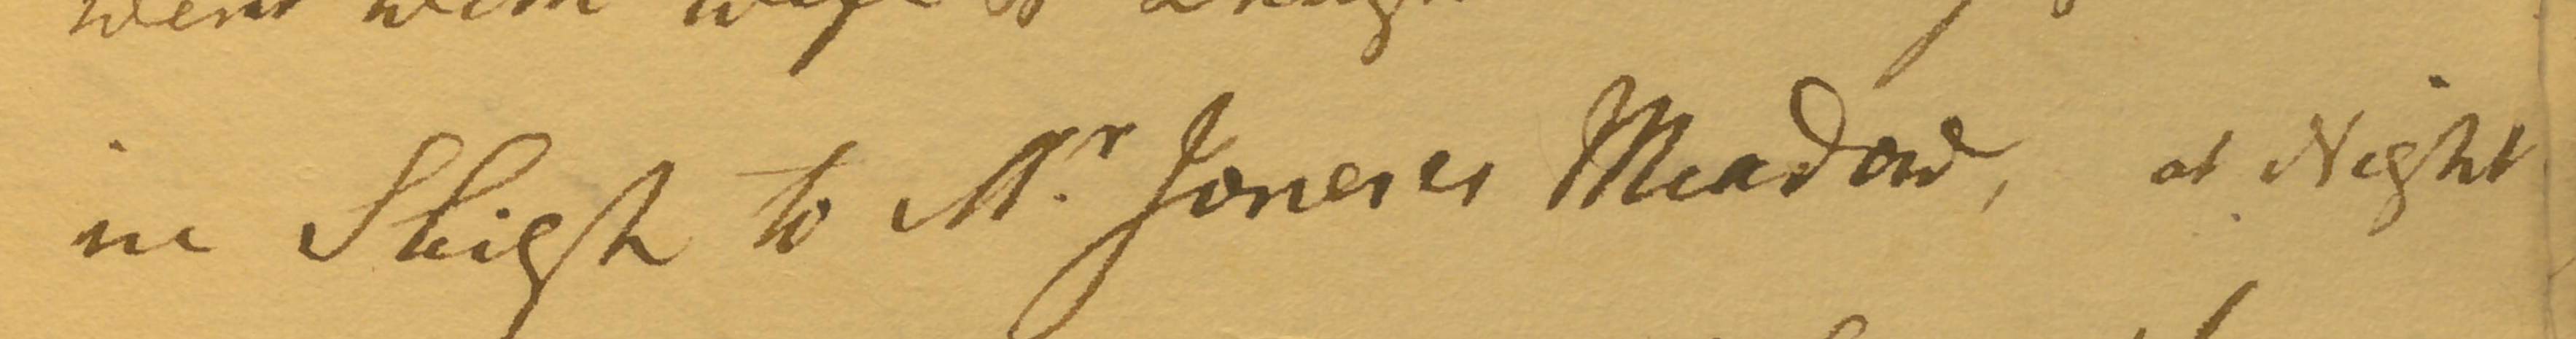in Sleigh to M^r. Joneses Meadow, at Night
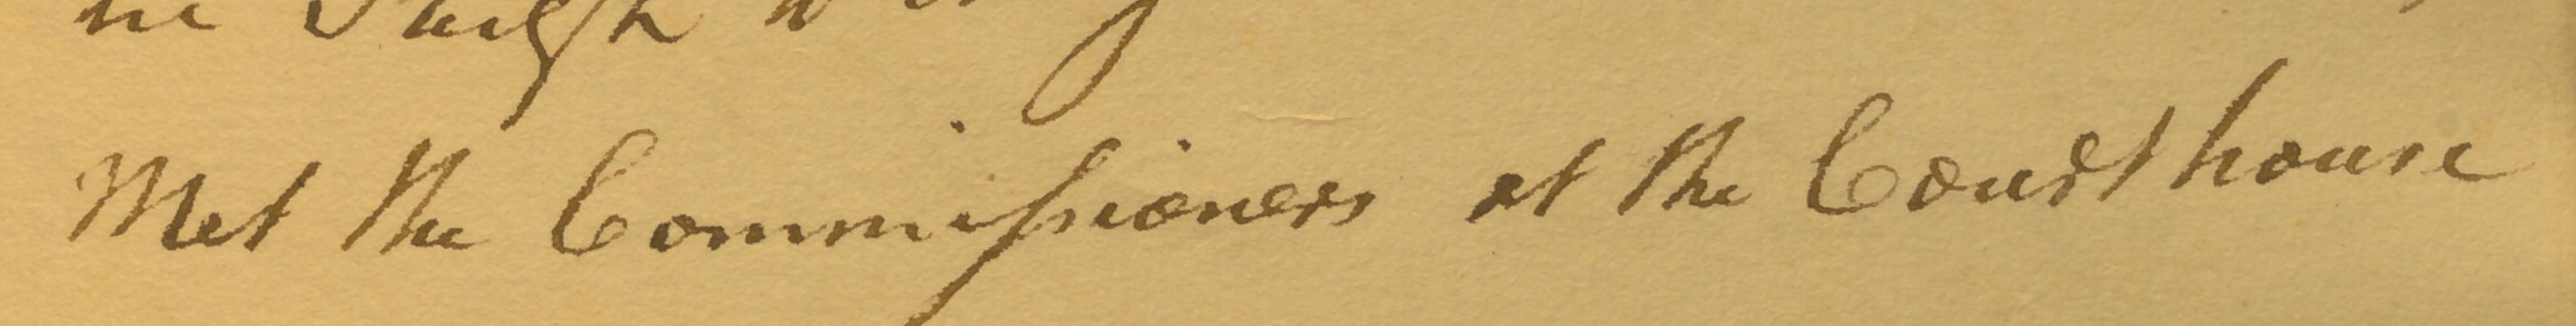Met the Commissioners at the Courthouse
